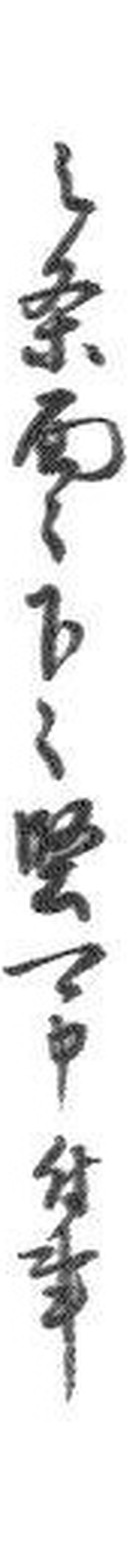之条面々下々堅可申付事
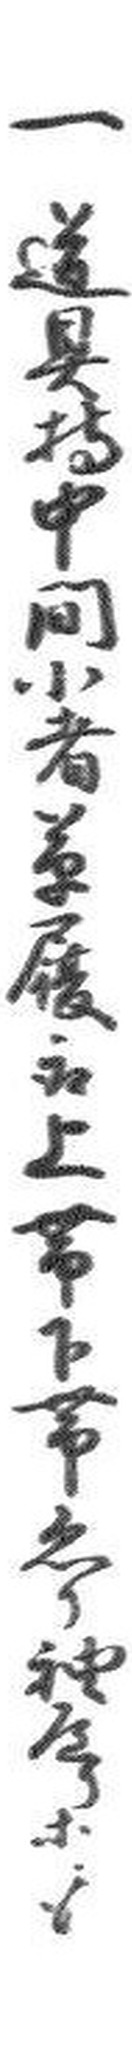一道具持中間小者草履取上帯下帯えり袖へり等ニも
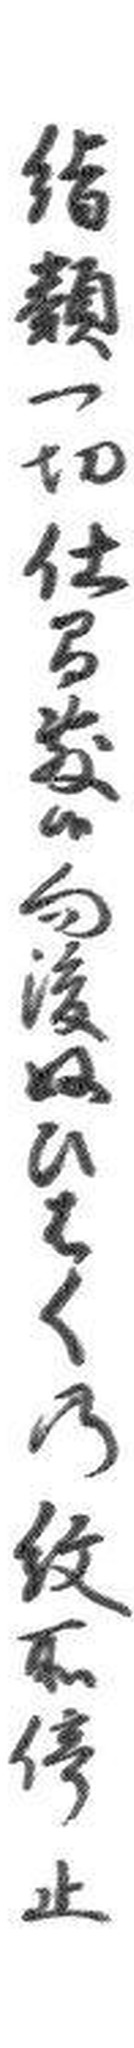絹類一切仕間敷候向後ぬいはくの紋所停止
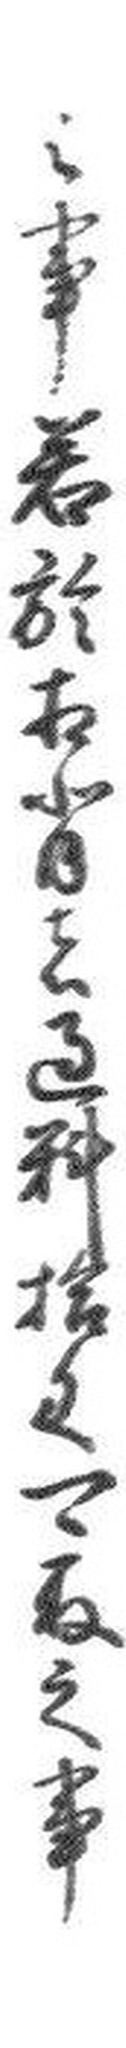之事若於相背者過料拾匁可取之事
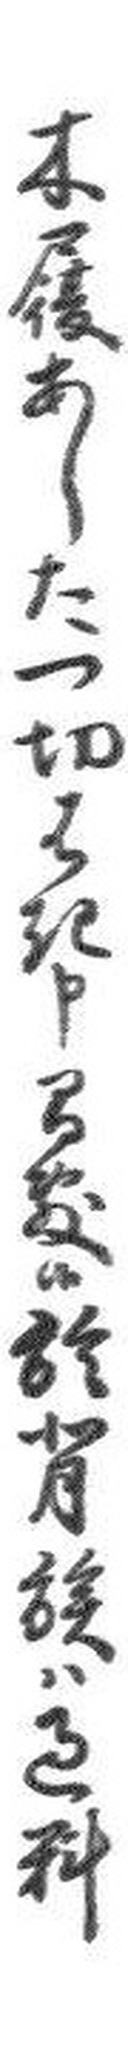木履あした一切はき申間敷候於背族ㇵ過料
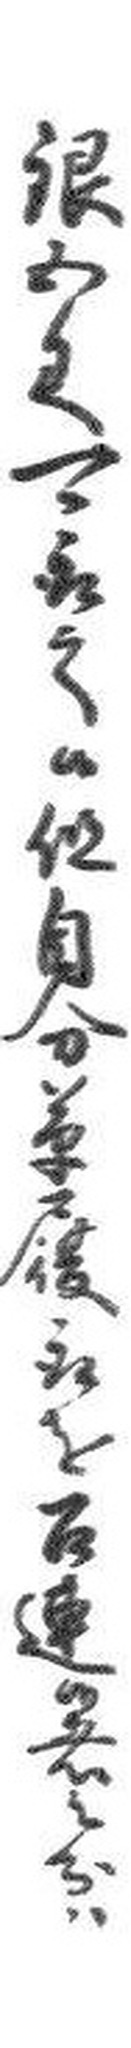銀五匁可取之候但自分草履取を召連候者之分ㇵ
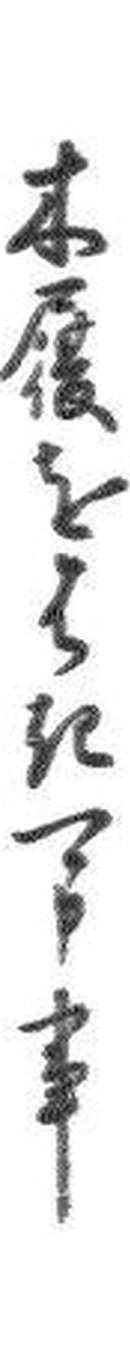木履をはき可申事

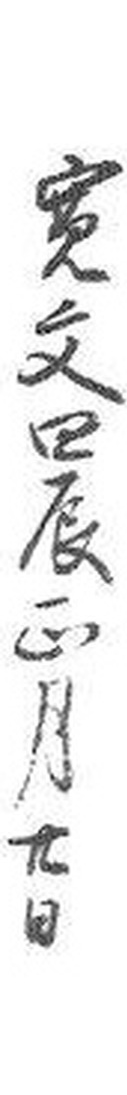寛文四辰正月廿日
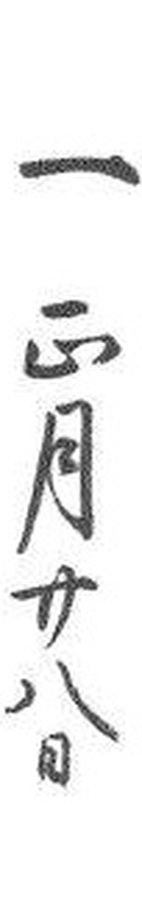一正月廿八日
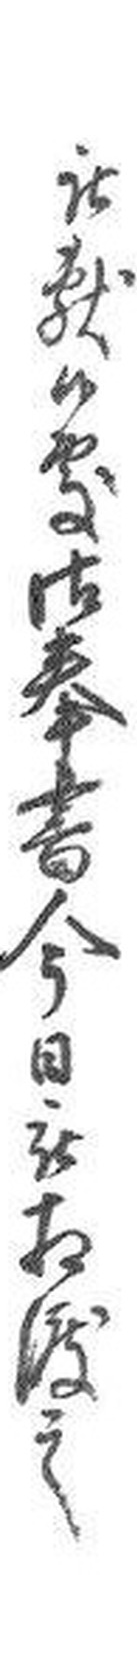被献候処御奉書今日被相渡之
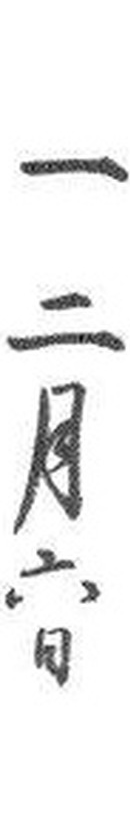一二月六日
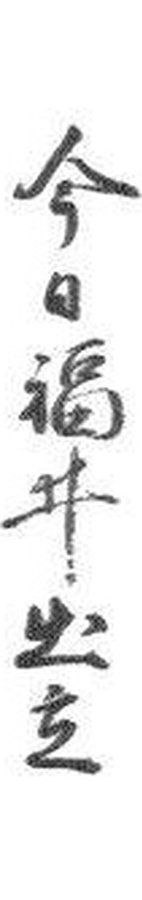今日福井出立
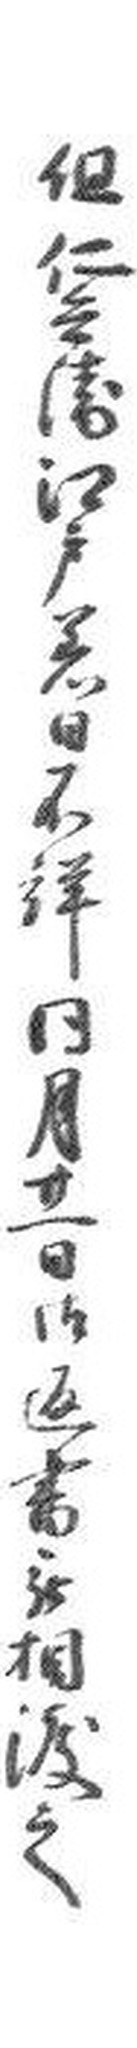但仁兵衛江戸着日不詳同月廿一日御返書被相渡之
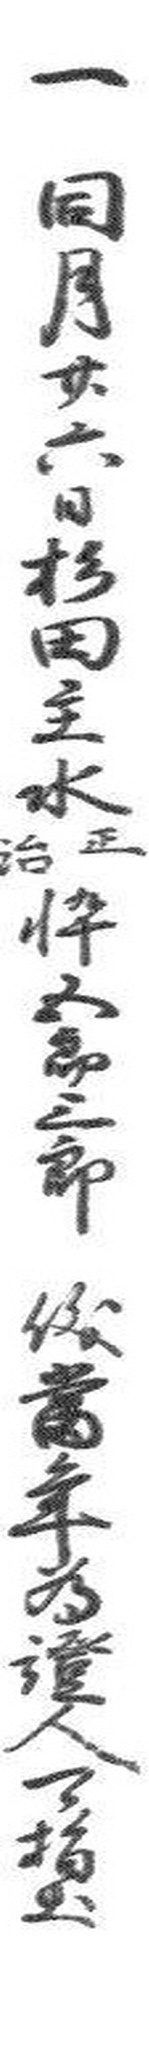一同月廿六日杉田主水正治忰五郎三郎儀当年為証人可指出
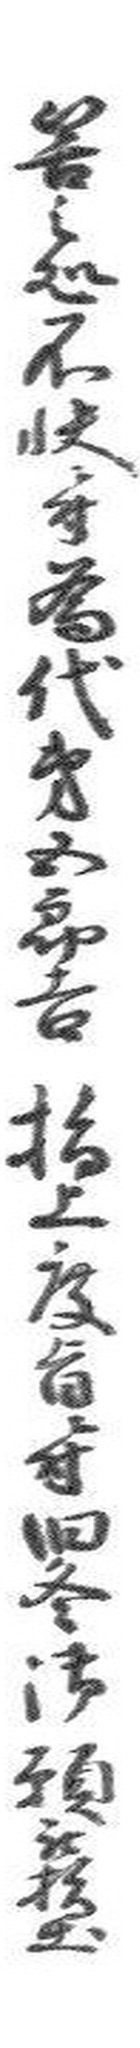筈之処不快ニ付為代弟五郎吉指上度ニ付旧冬御願被指出
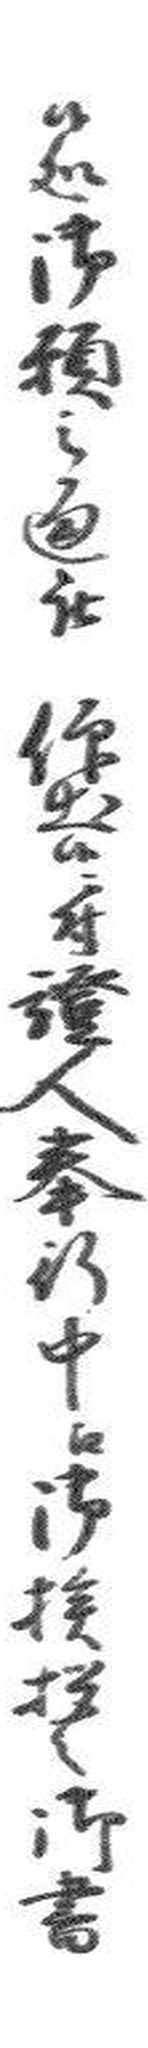候処御願之通被仰出候ニ付証人奉行中江御挨拶之御
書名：家譜 七 光通公 従寛文四年到同九年
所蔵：福井県文書館 Fukui Prefectural Archives
